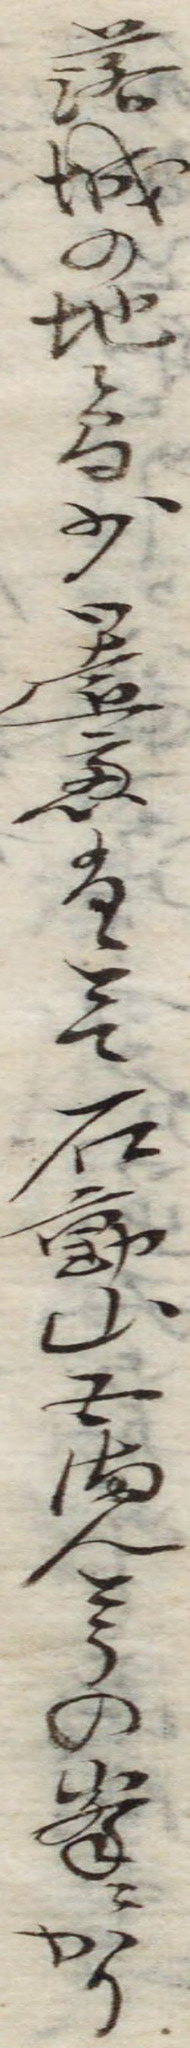落城の地候間少御遠慮は候とて石動山五まんとうの峰かり
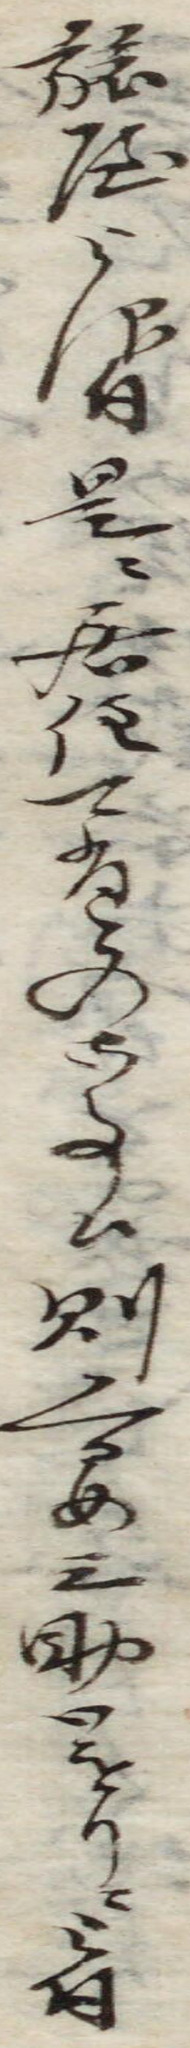旅屋被仰付是居住可有との御事候則くるめ三助御をりに被付
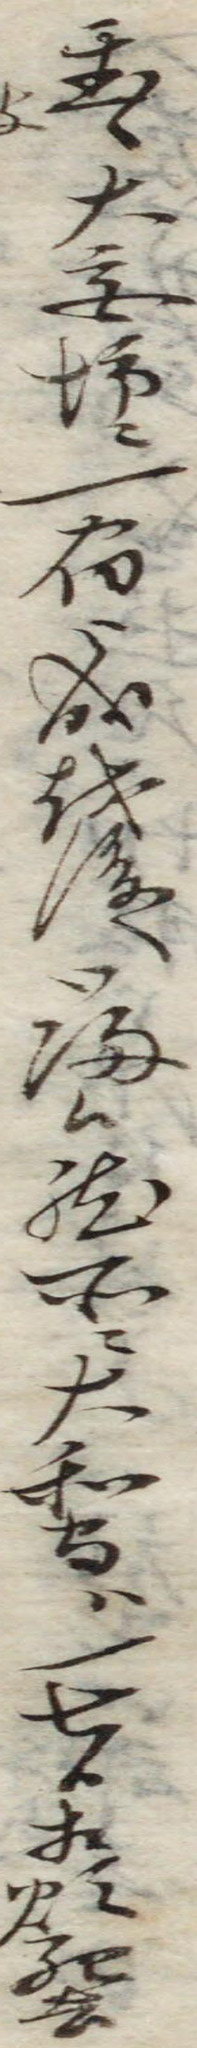置候大宮坊に一宿被成越後へ御帰候然所に大和守は一七日相煩死去
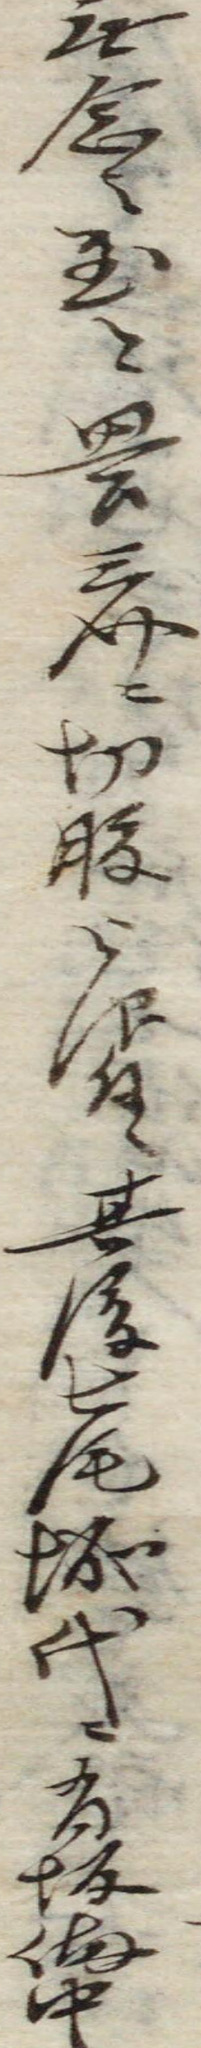無念之至と思召三介に切腹被仰付候其後七尾城代に有坂備中

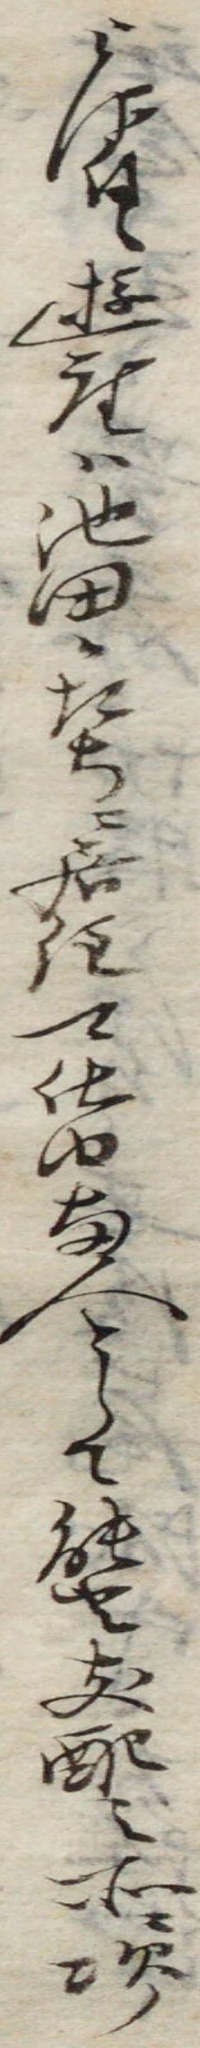被仰付候遊座は池田かたちに居住可仕由両人として能登支配之所に次ノ
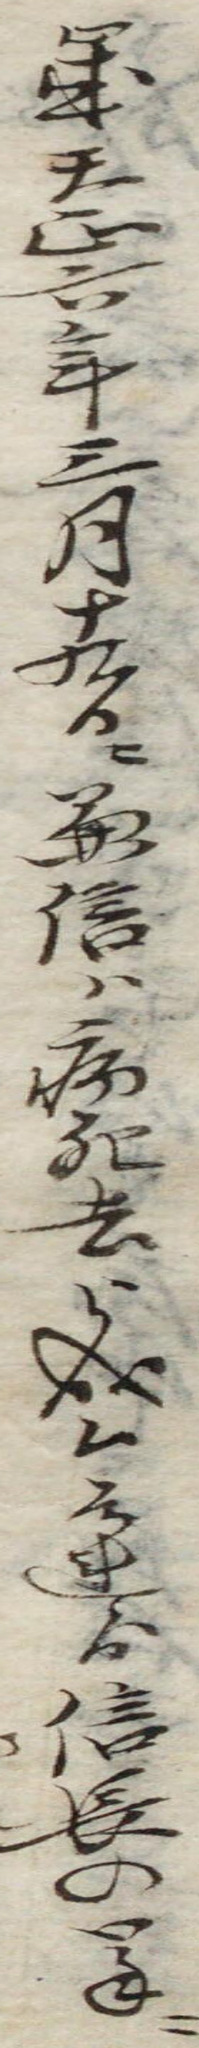歳天正六年三月十九日に兼信は病死去被成候それゟ信長の御手に
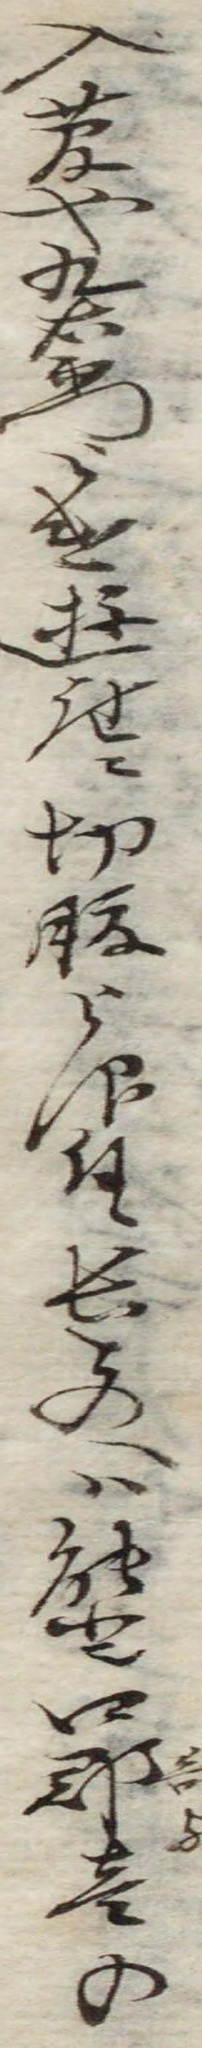入菅や九右衛門被遣遊座に切腹被仰付候長とのへは能登四郡壱の
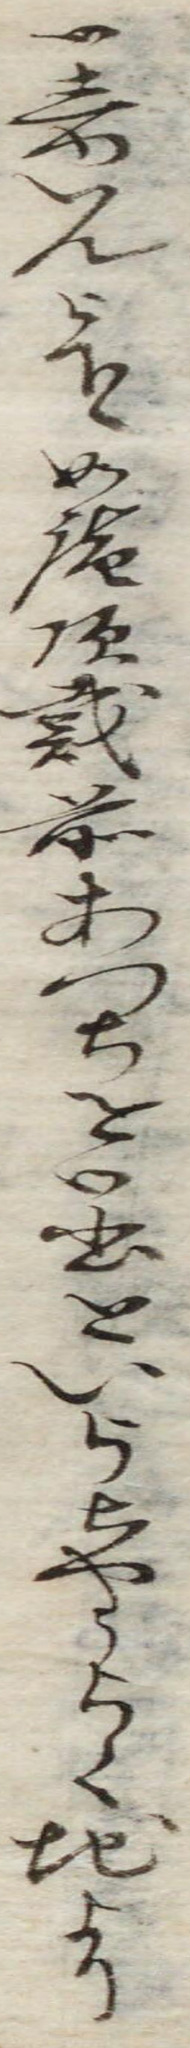御しゆいん被下候如庵頂戴前あつちを御書といらちやうらく地より
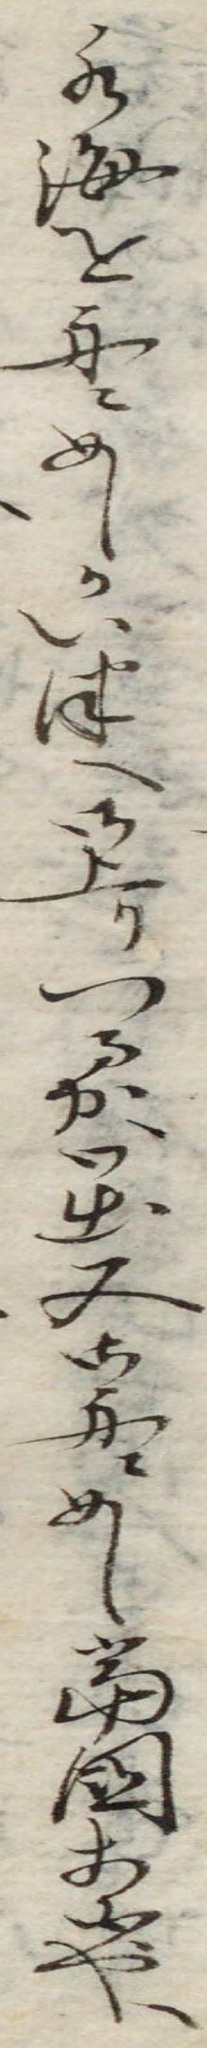水海を舟にめしかい津へ御上りつるかへ御出又御舟にめし当国おふやへ
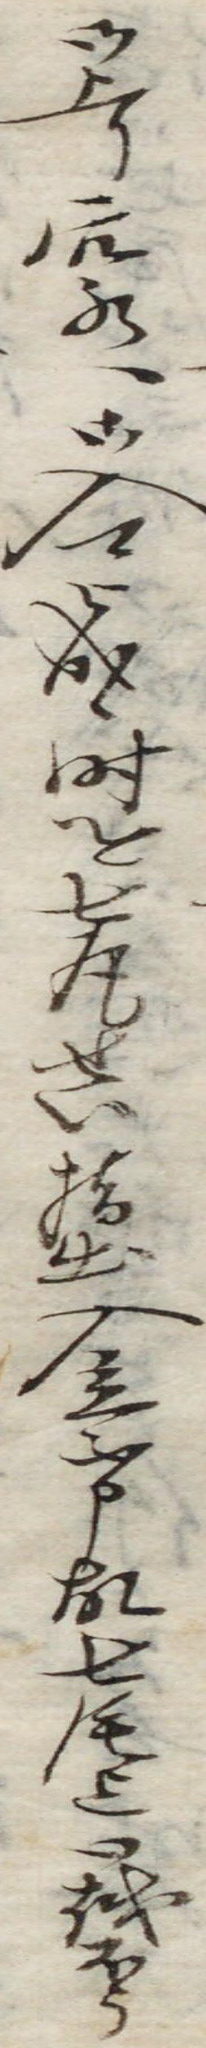御上り穴水へ御入可被成候時を七尾せい指出入立不申故七尾迄御越ほう
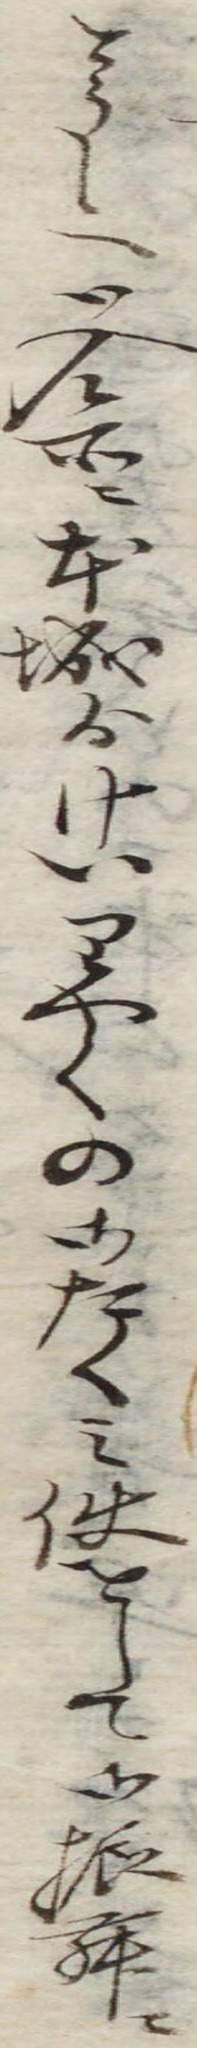とうしへ御入候所に本城ゟけいりやくの御たくみ使をして御振舞に
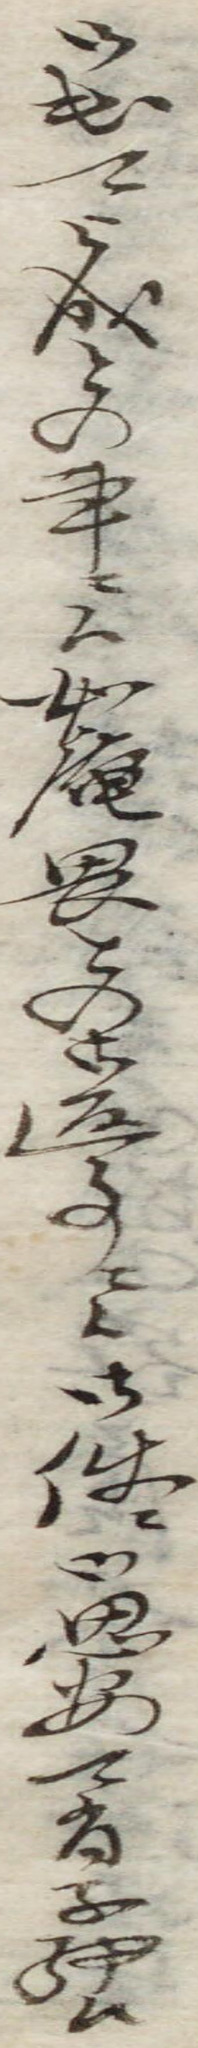御出可被成との事に候如庵畏との御返事に候御使に御思安可有子細候
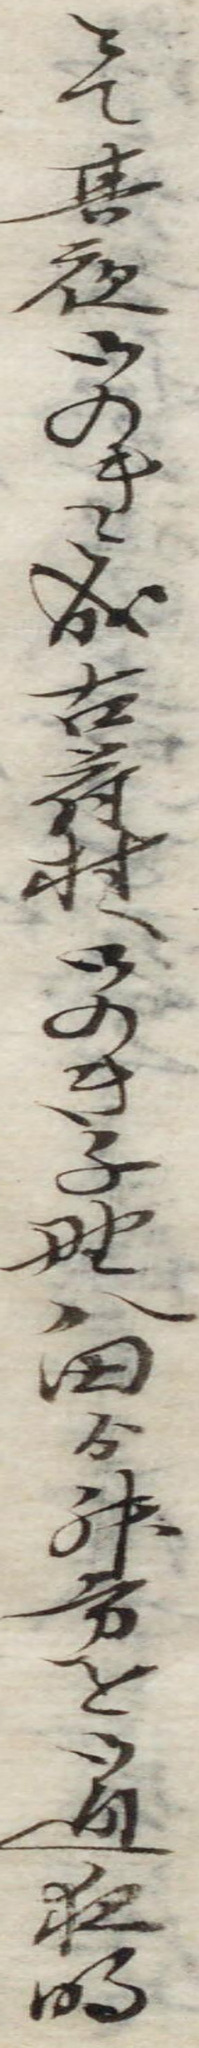とて其夜御のき被成古荷村へ御のき千野八田ゟ舛方を御通夜明
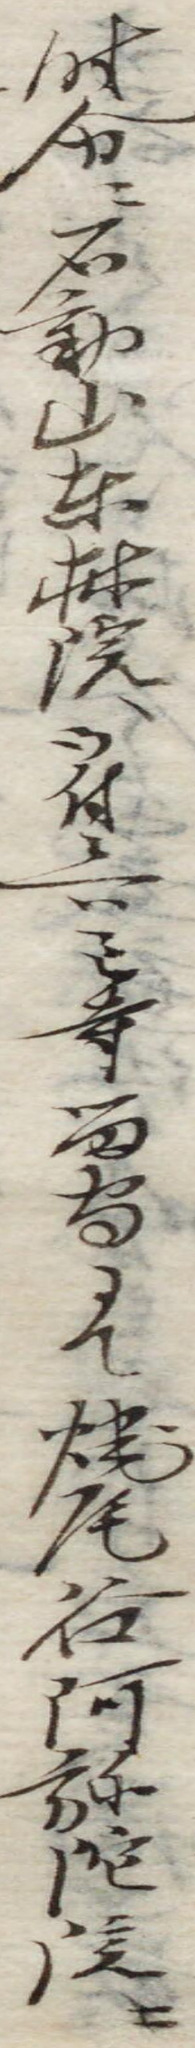時分に石動山東林院へ御付候へは主寺留守にて焼尾谷阿弥陀院に
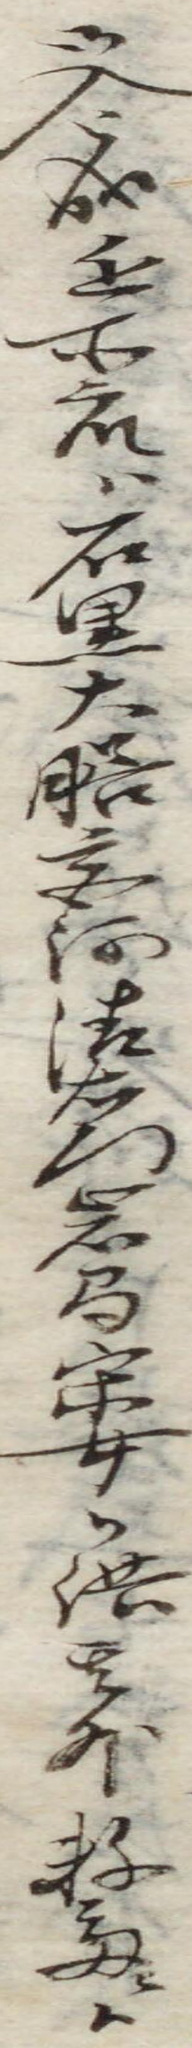御入被成近所衆は石黒大膳宮河清右衛門岩間宋女御供其外数多に候
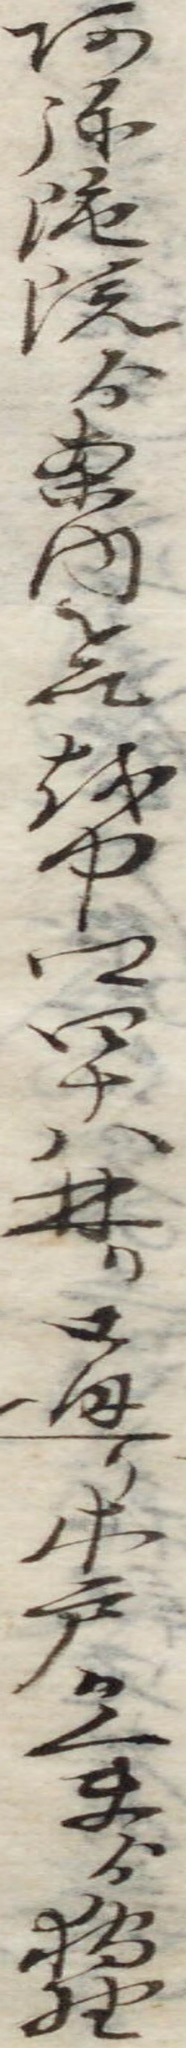阿弥陀院ゟ案内を以越中郷四十八林り御通り木戸かくまゟ狩野
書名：古老紀談等
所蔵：Ishikawa Prefectural Library
